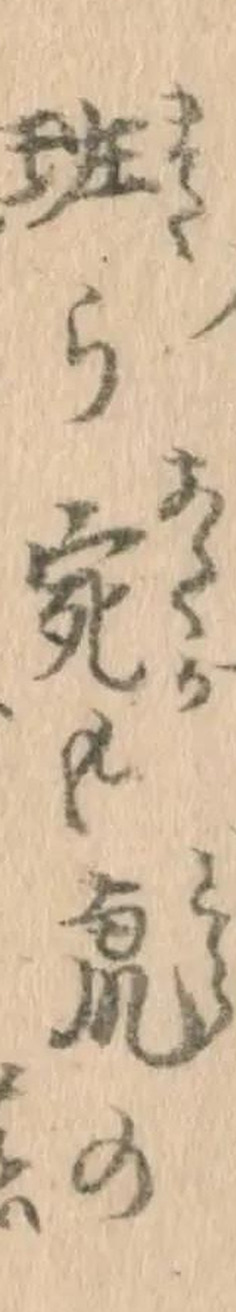班ら宛も虎の
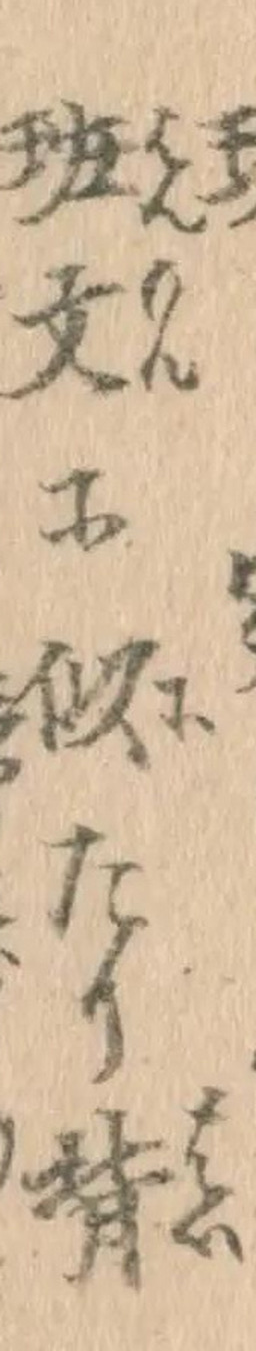斑文に似たり背
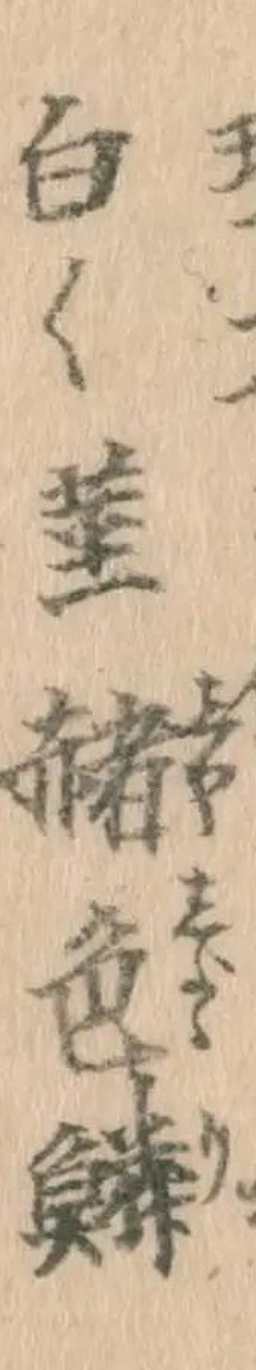白く茎赭色鱗
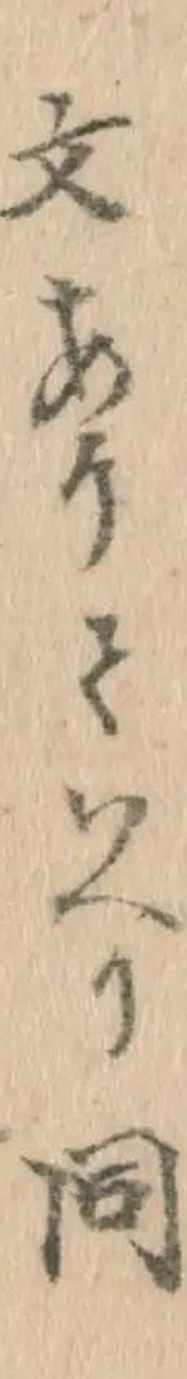文ありといへり同
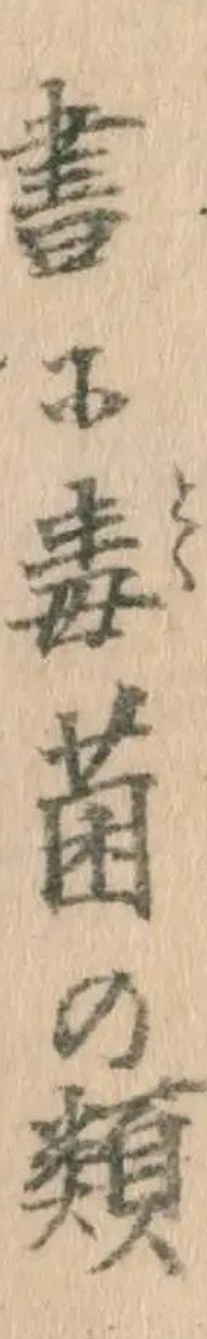書に毒菌の類
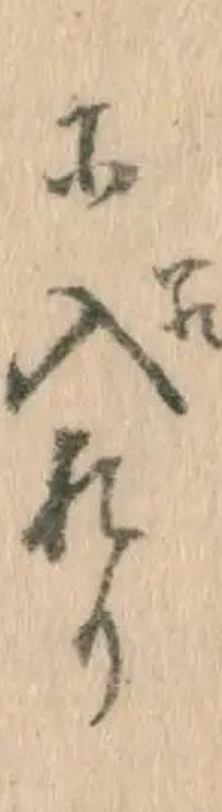に入れり
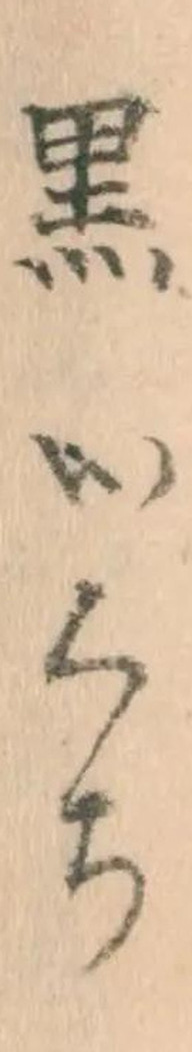黒いくち
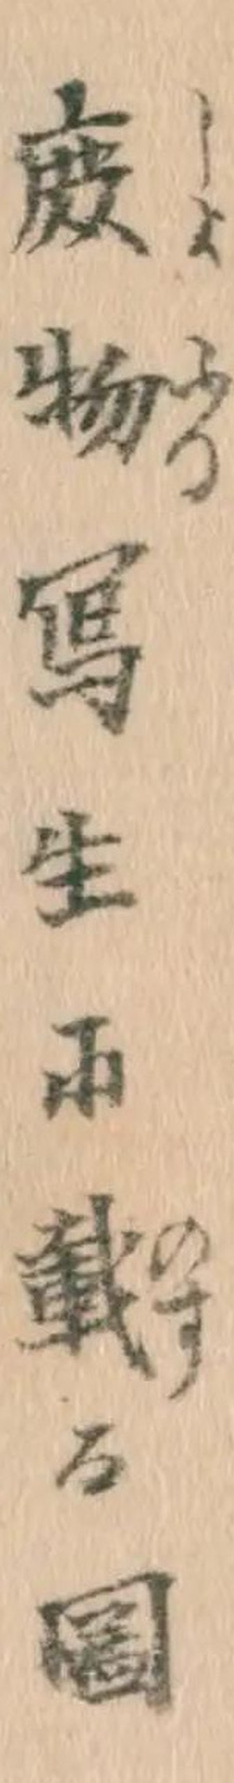庶物写生に載る図
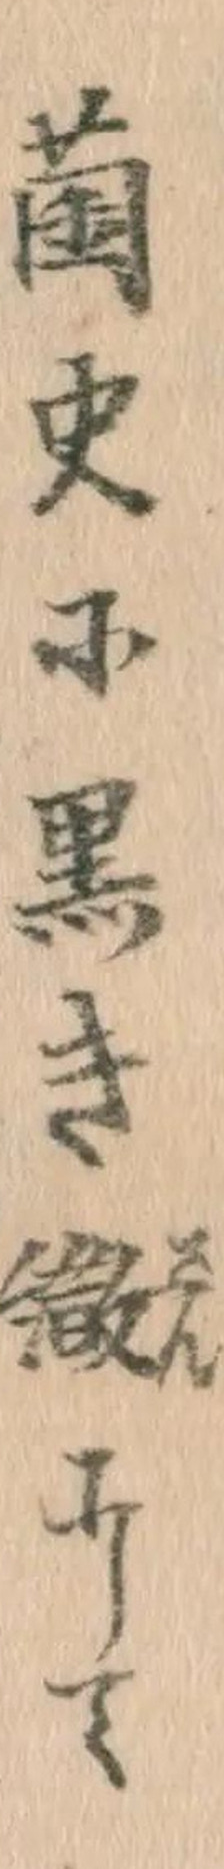菌史に黒き繖にして
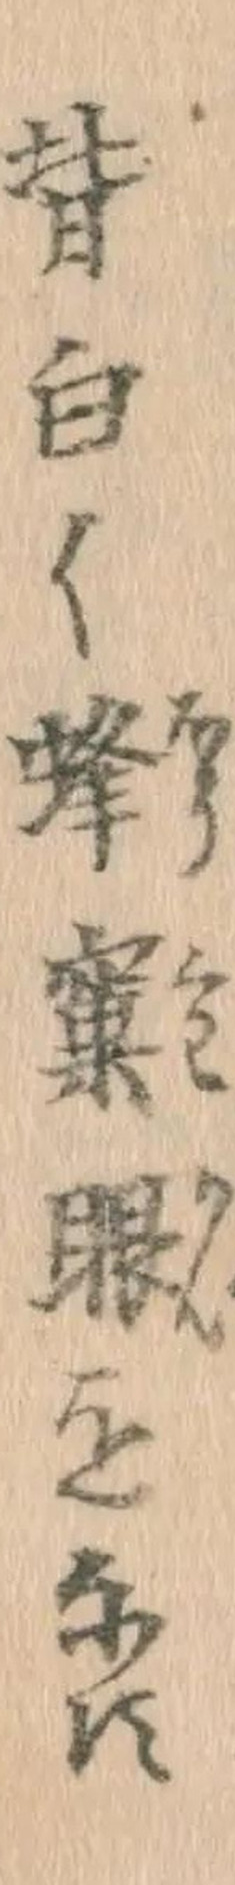背白く蜂窠眼をなす
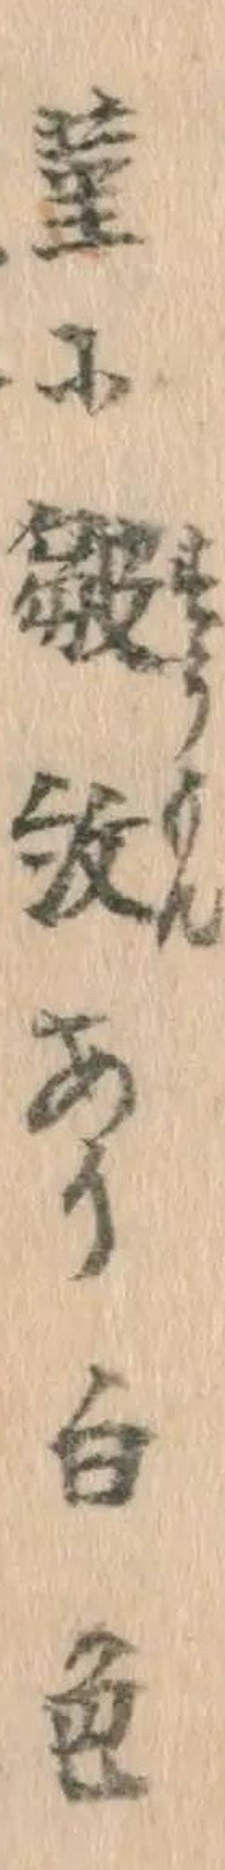茎に皺紋あり白色
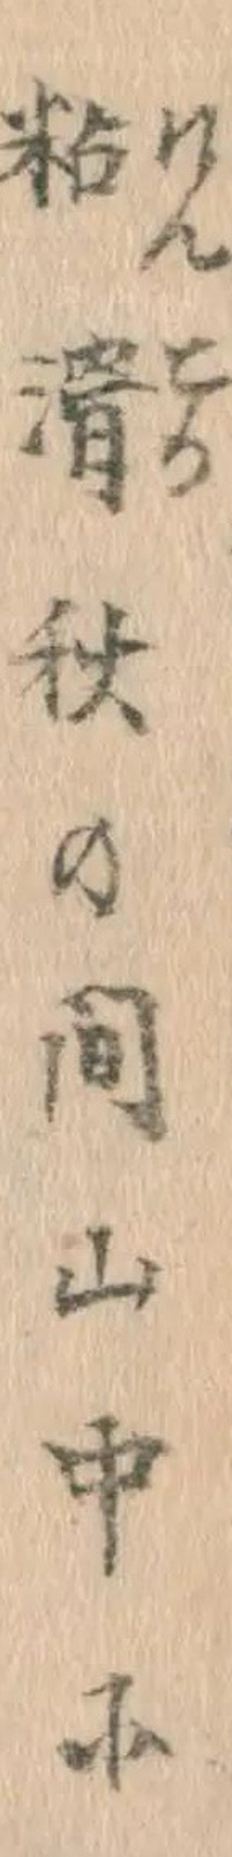粘滑秋の間山中に
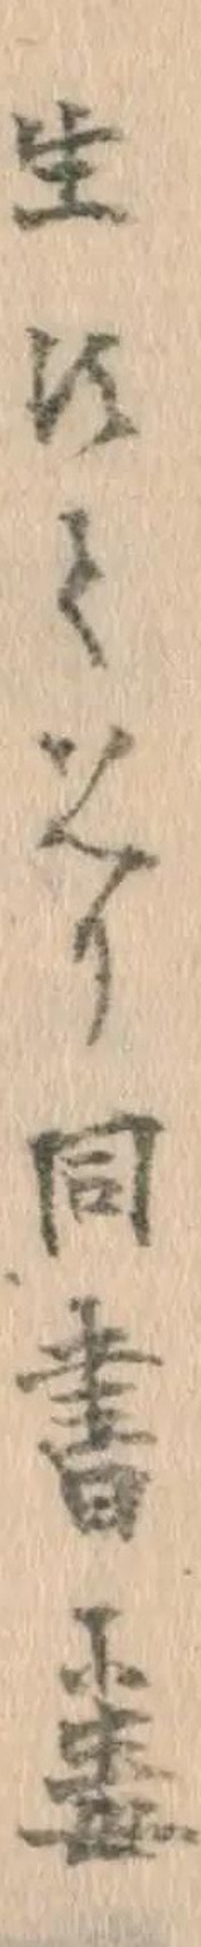生すといへり同書に毒
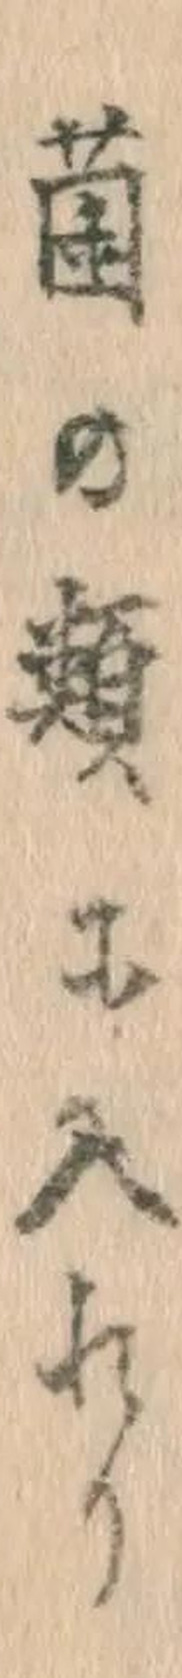菌の類に入れり

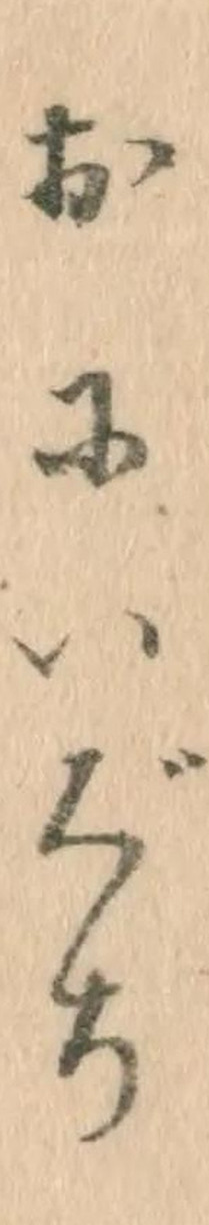おにいぐち
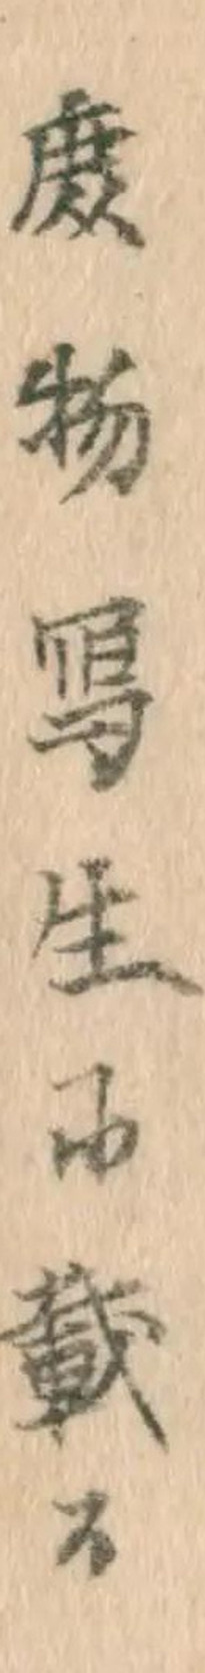庶物写生に載る
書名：本草図譜. 巻58-60
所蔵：国立国会図書館 National Diet Library, JAPAN
